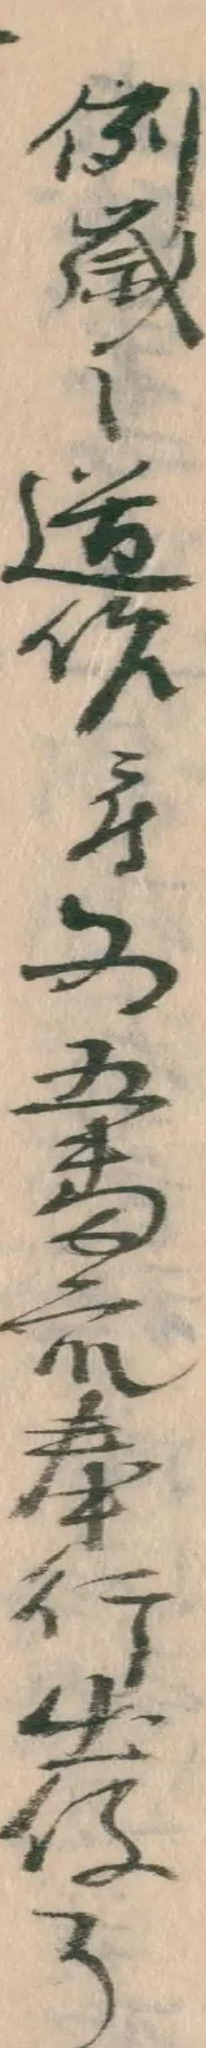例歳之道作ニ付文五番衆奉行出役了
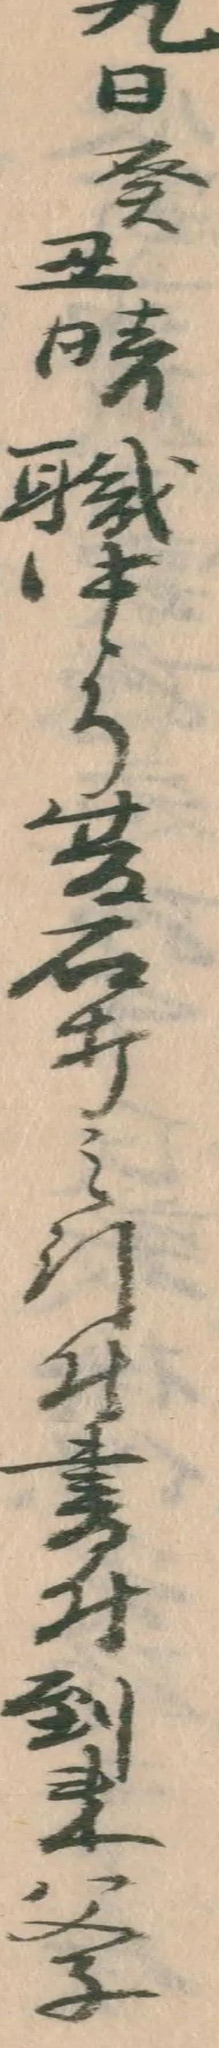九日癸丑晴職中より夏石打之引計書付到来父子
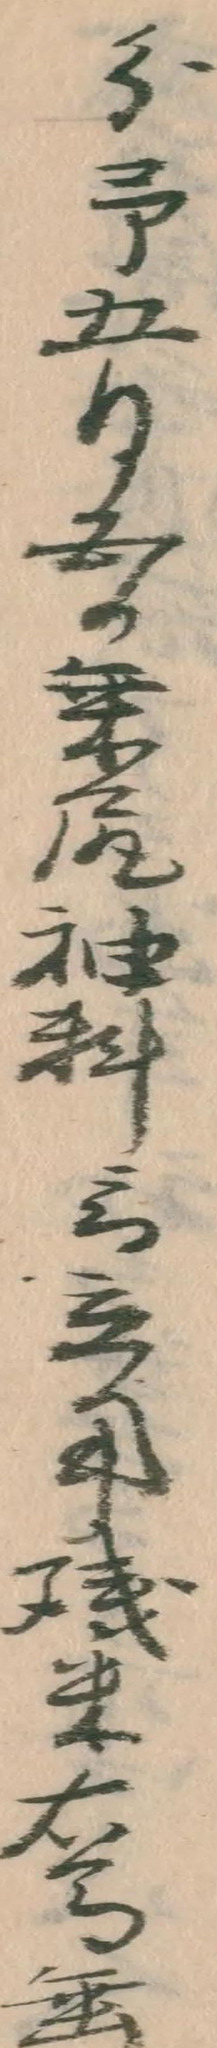分予五月五日乗尻神料ニ而立用残米右衛門垂
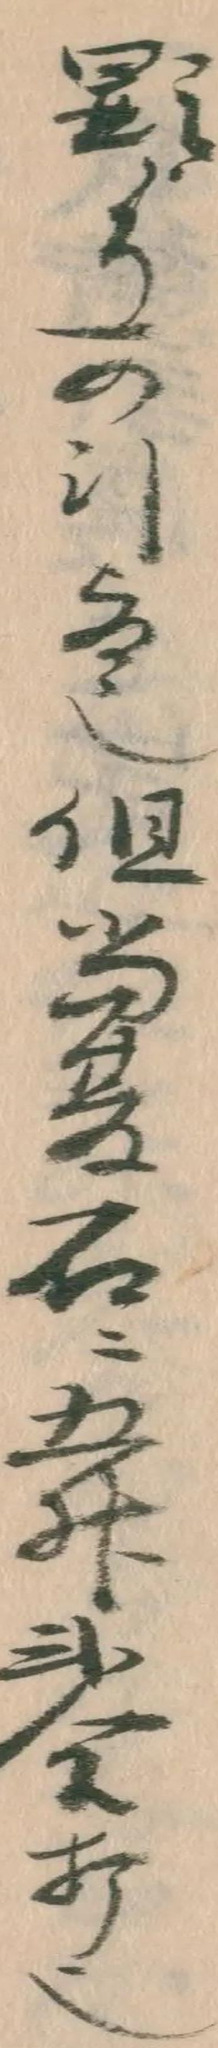顕より可引旨也但當夏石ニ五升弐合打也
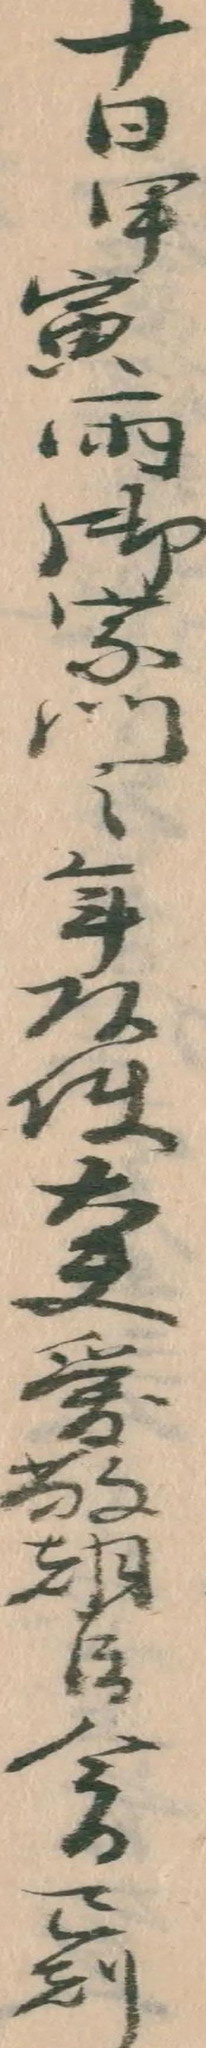十日甲寅雨御家門之年頭使大夫愛敬朝臣今日已刻
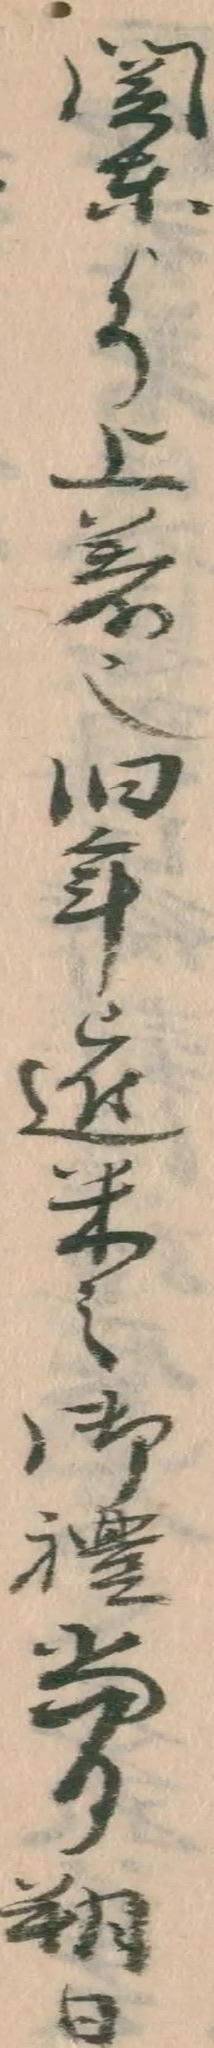関東より上着也旧年被近米之御禮當月朔日
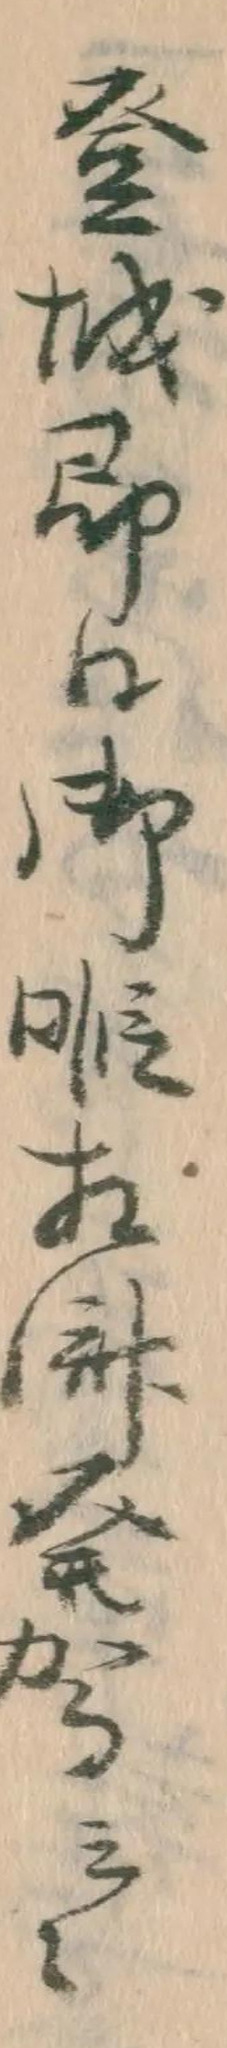登城即日御暇相済発駕云々
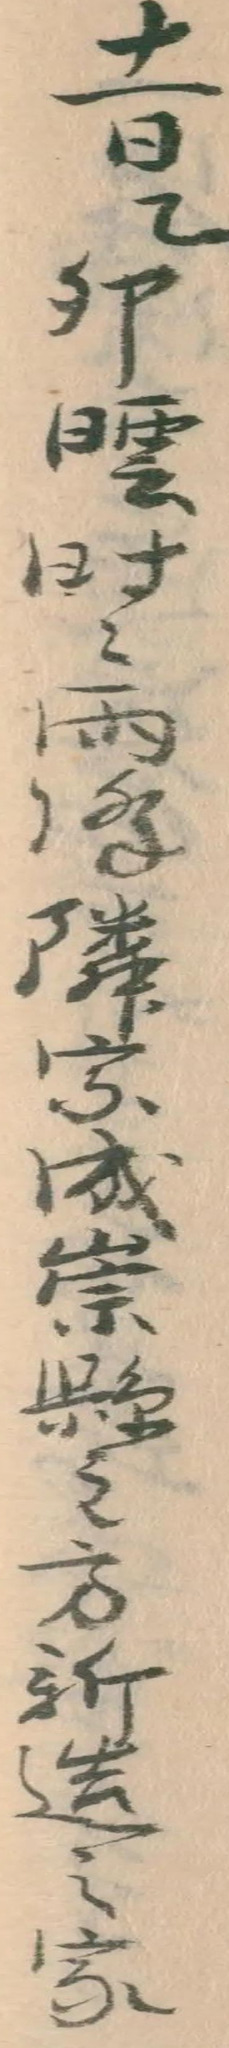十一日乙卯雲時々雨降隣家成祟縣主方新造之家
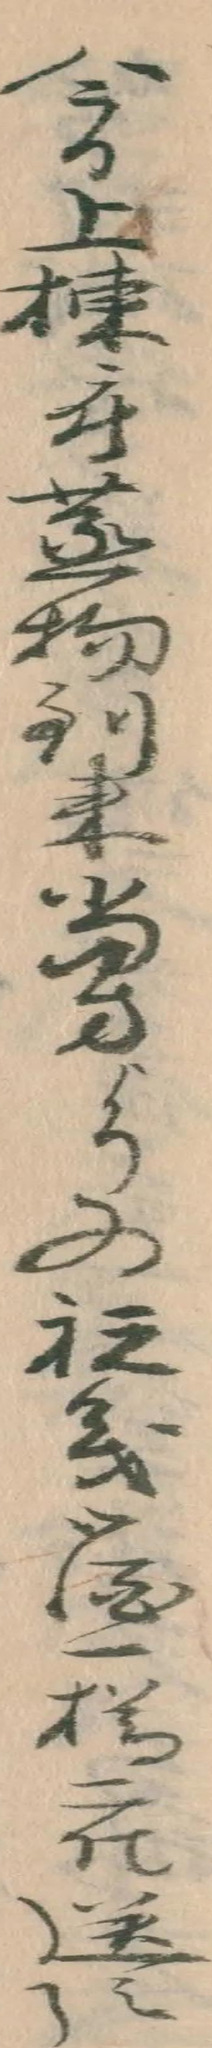今日上棟ニ付蒸物到来當方より為祝義御渡一橋充送之
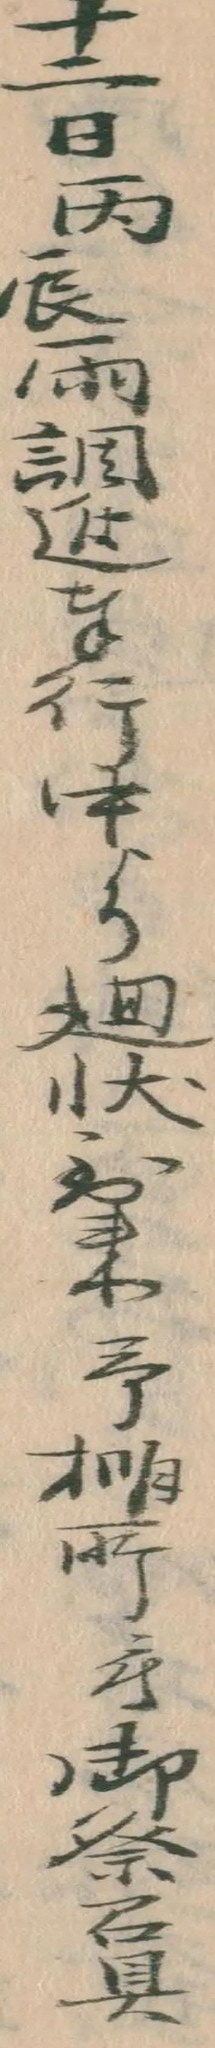十二日丙辰雨調進奉行中より廻状到来予棚所ニ付御祭被召具
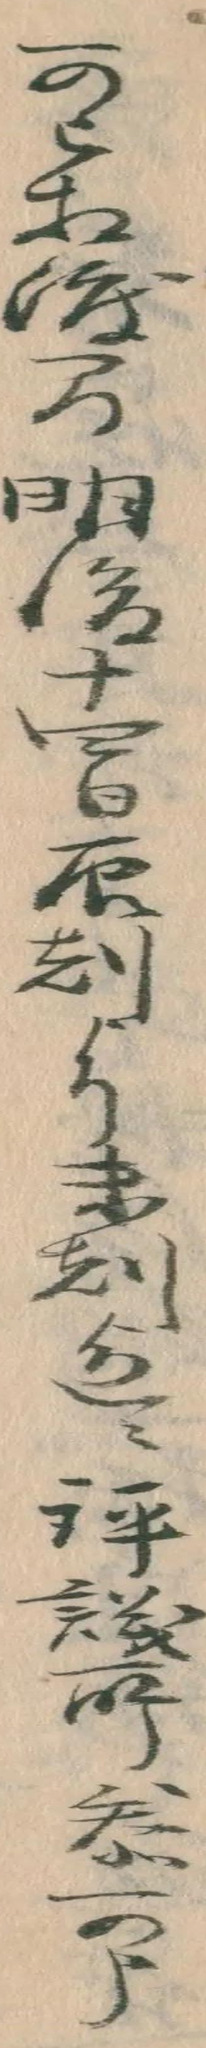可被相渡間明後十四日辰刻より未刻迄に評議所参可申
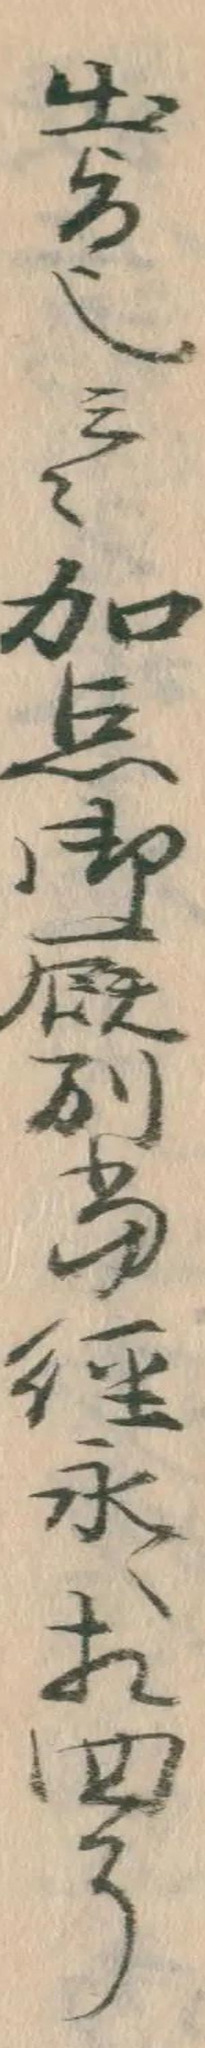出旨也云々加点御厩別當経永へ相回了
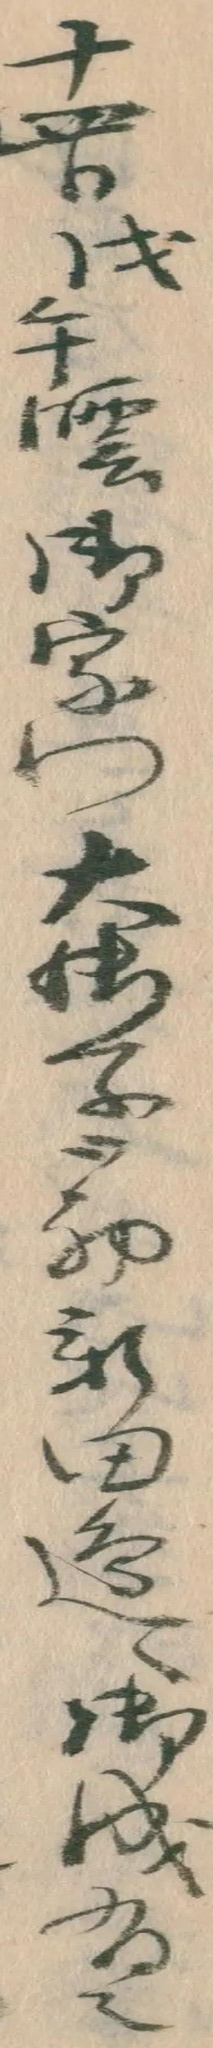十四日戌午雲御家門大御子御初新田邊へ御成有之
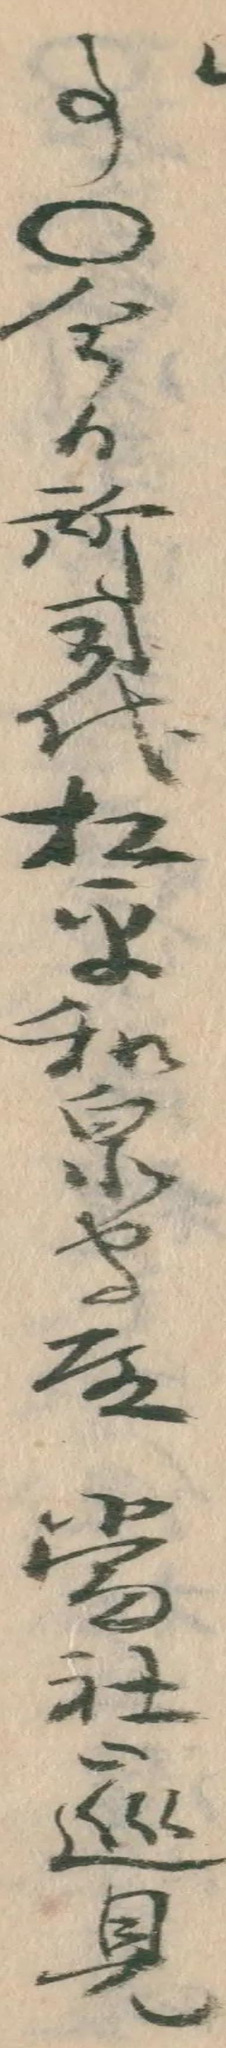事○今日所司代松平和泉守殿當社御巡見
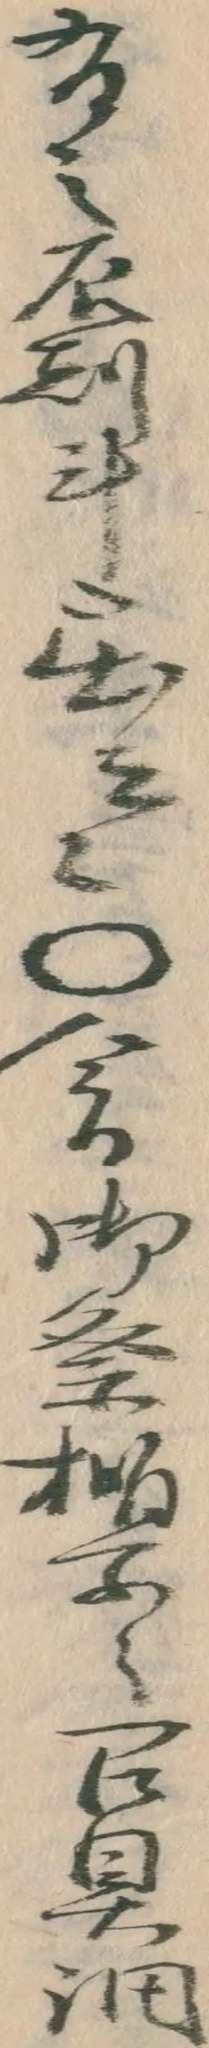有之辰刻斗御出云々○今日御祭棚早々召具調
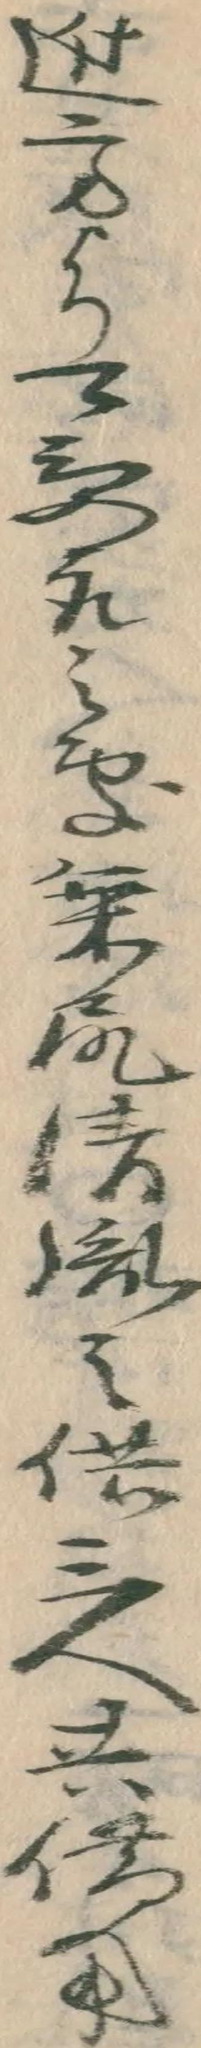近方より可受取之處乗尻清胤之供三人其借用
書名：賀茂社記録. 第63冊
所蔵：国立国会図書館 National Diet Library, JAPAN
